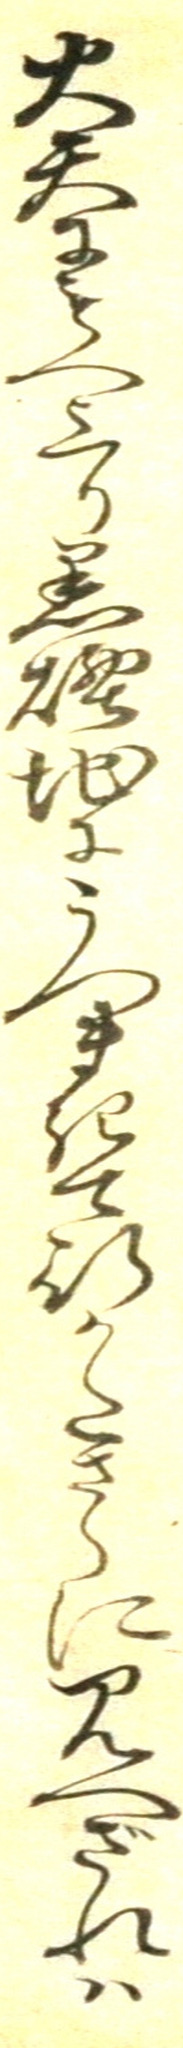火天にもへ上り黒煙地にうつまきて行かたさらに見へざれは
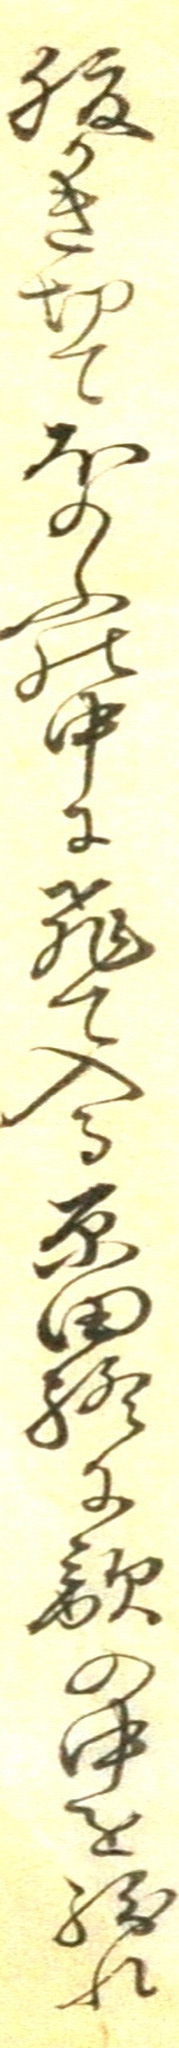腹かき切てほのふの中に飛て入る原田終に敵の中を紛れ
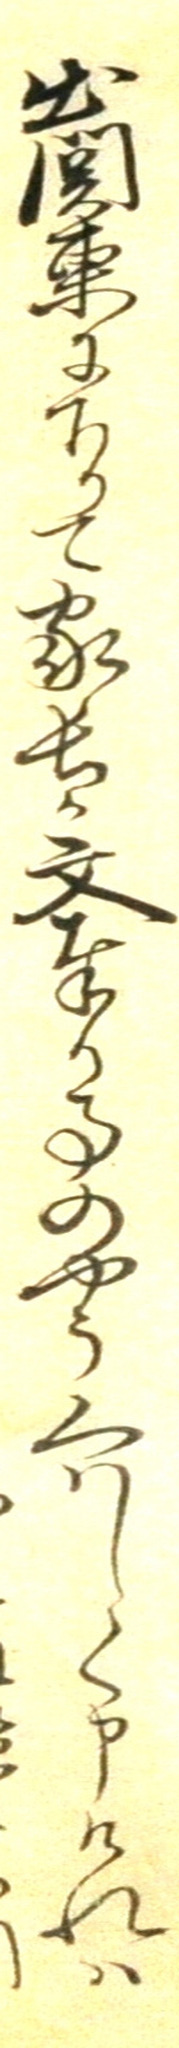出関東に下りて家長か文奉り事のやうくはしく申けれは

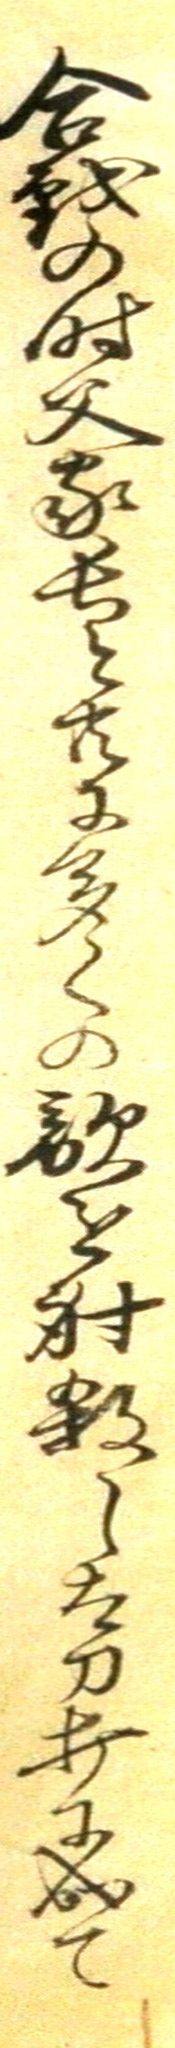合戦の時父家長と共に多くの敵を射殺し太刀打に成て
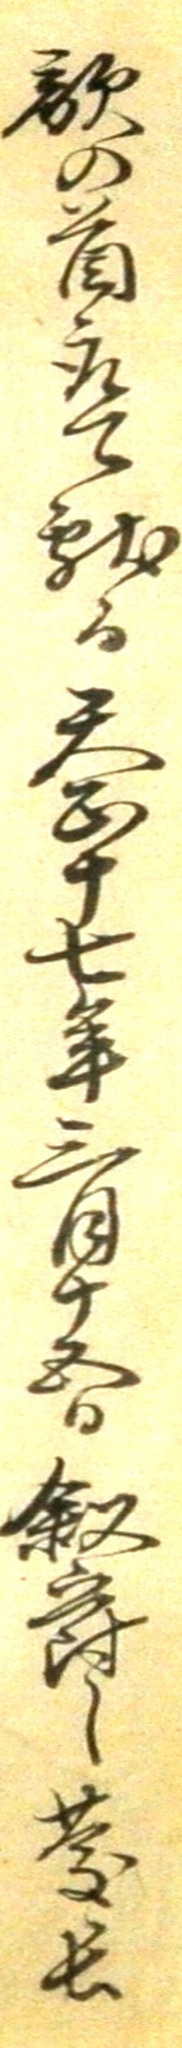敵の首取て献る天正十七年三月十五日叙爵し慶長
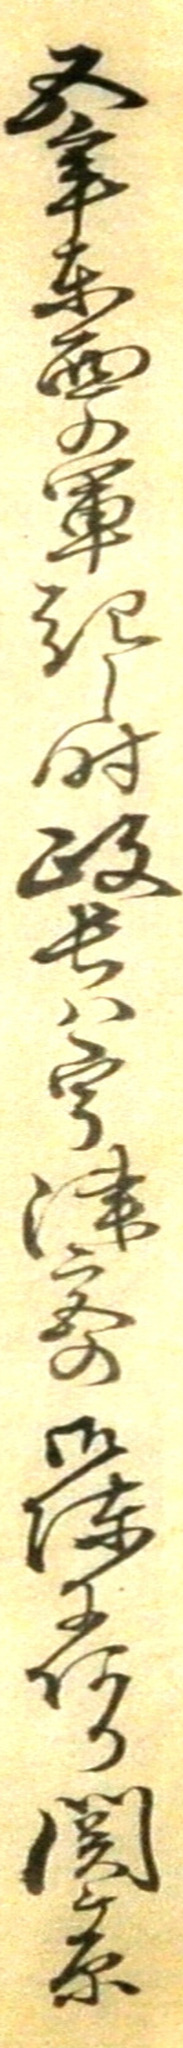五年東西の軍起し時政長は宇津宮の御陣にあり関ヶ原
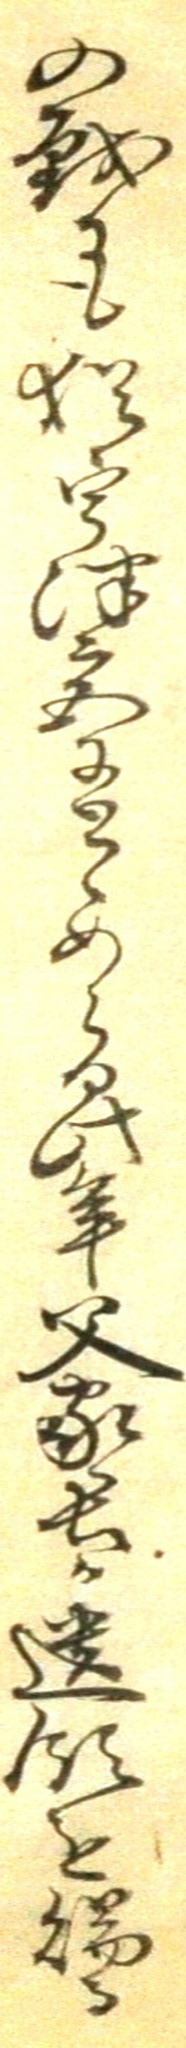の戦にも猶宇津宮にとゝめらる此年父家長か遺領を賜る
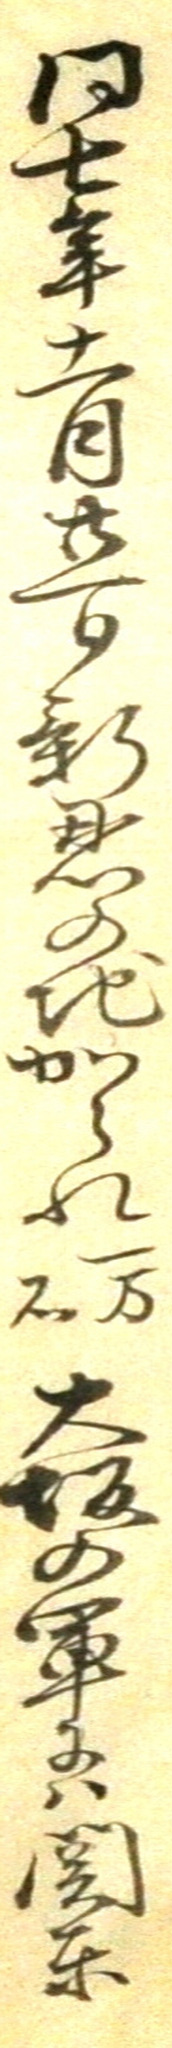同七年十一月廿一日新恩の地加られ一万石大坂の軍には関東
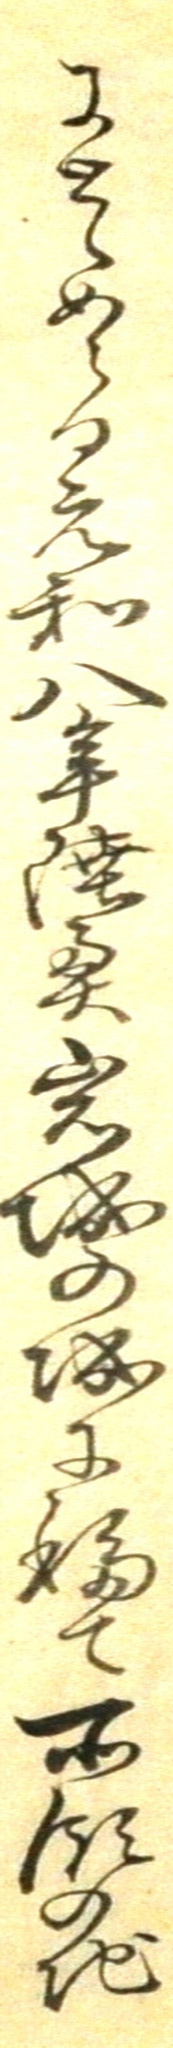にとゝめらる元和八年陸奥岩城の城に移て所領の地
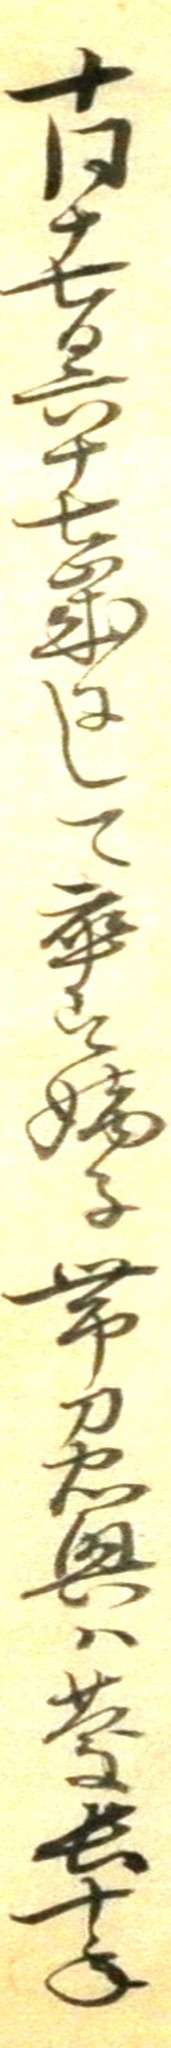十月十七日六十七歳にして卒す嫡子帯刀忠興は慶長十年
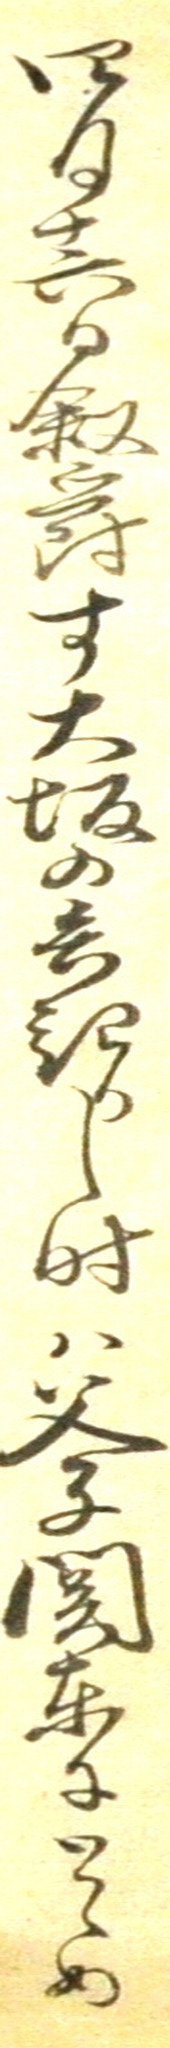四月十六日叙爵す大坂の兵起りし時は父子関東にとゝめ
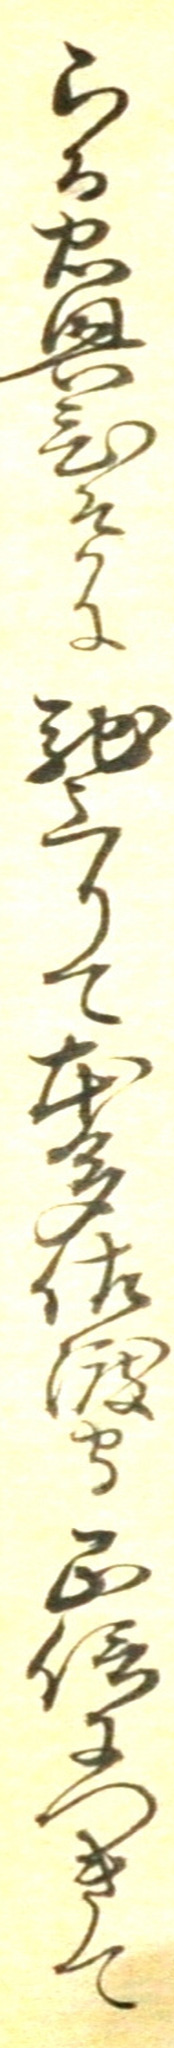らるただ忠興ひそかに馳上りて本多佐渡守正信につきて
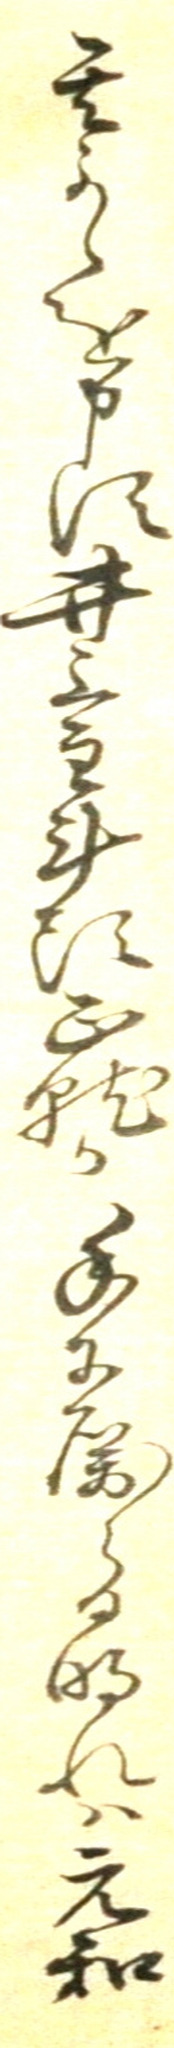其よしを申す井上主計頭正就か手に属らる明れは元和
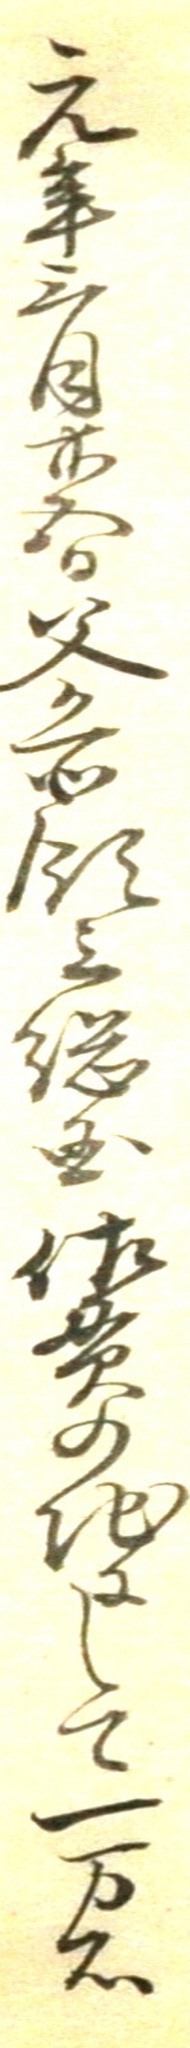元年三月廿五日父か所領上総国佐貫の地にして一万石
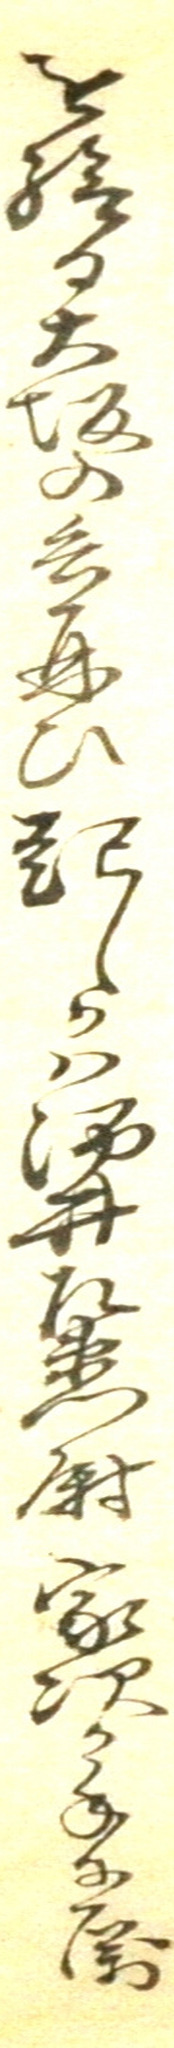を給る大阪の兵再ひ起しかは酒井左衛門尉家次か手に属
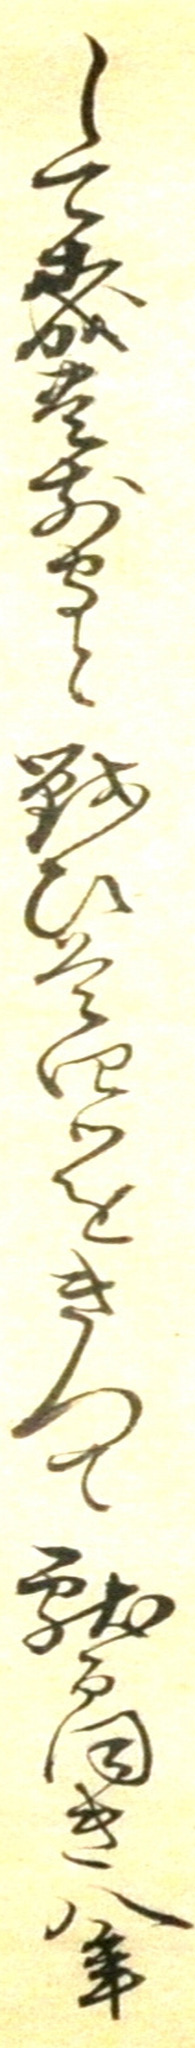して森豊前守と戦ひ首四ツをきつて献る同き八年
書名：藩翰譜（四・中）
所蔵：伊那市立高遠町図書館・合同会社AMANE
